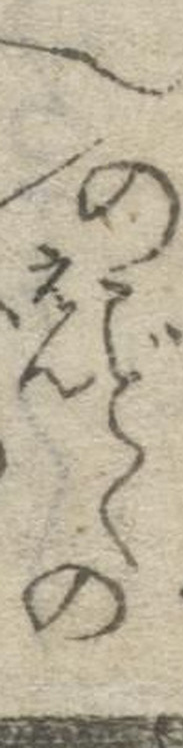のごとくの
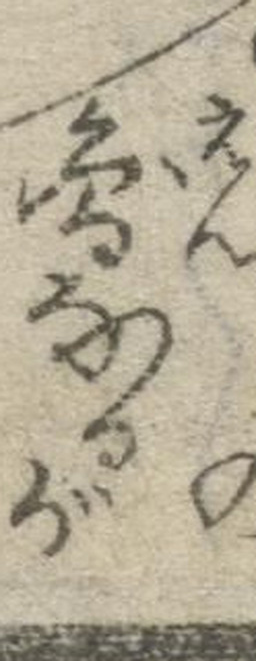円なるが
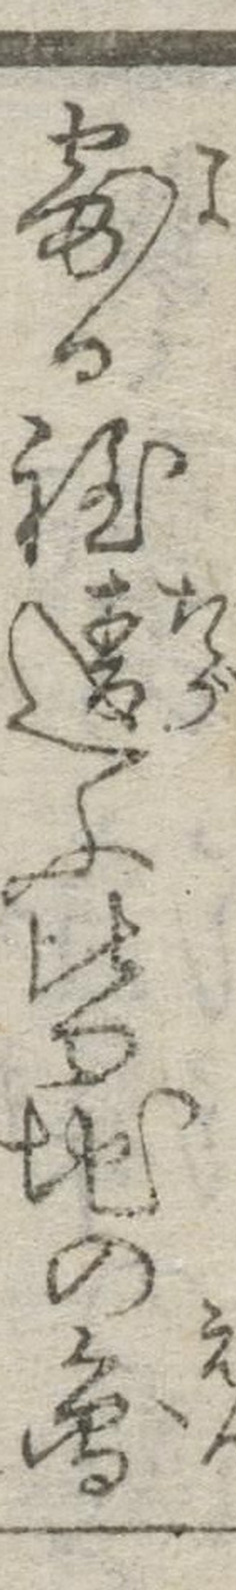寄る程違ふ皆地の円
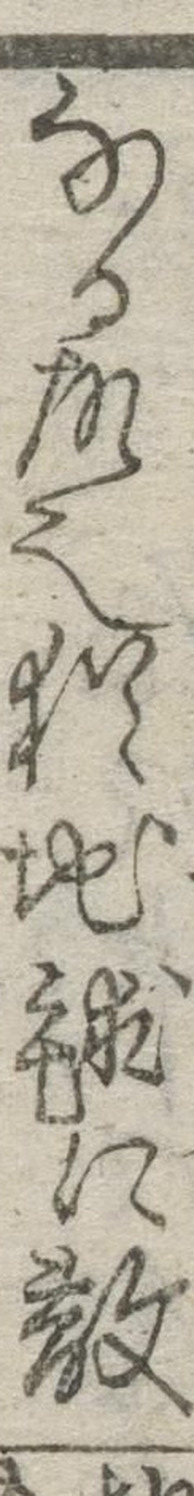なる故也猶地毬に散
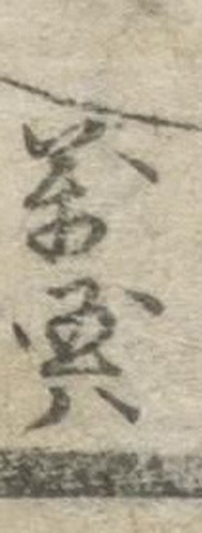万国は
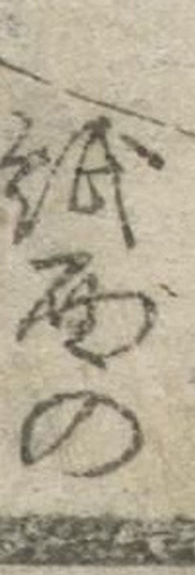紙面の
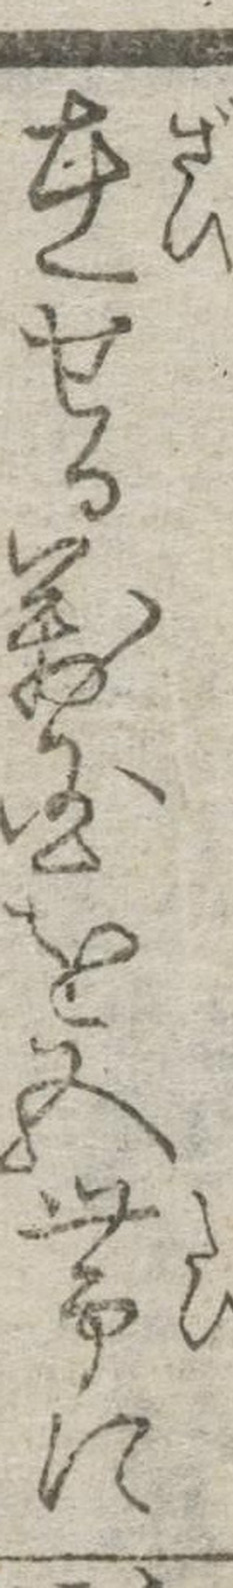在せる万国を五帯に
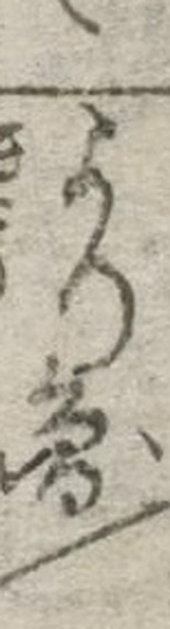より円
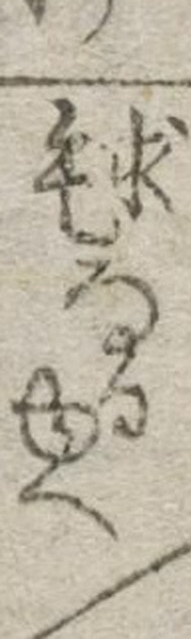毬なるゆへ
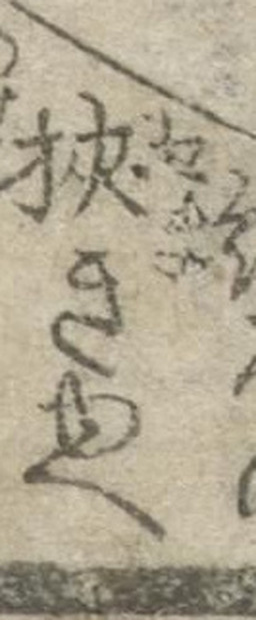狭きゆへ
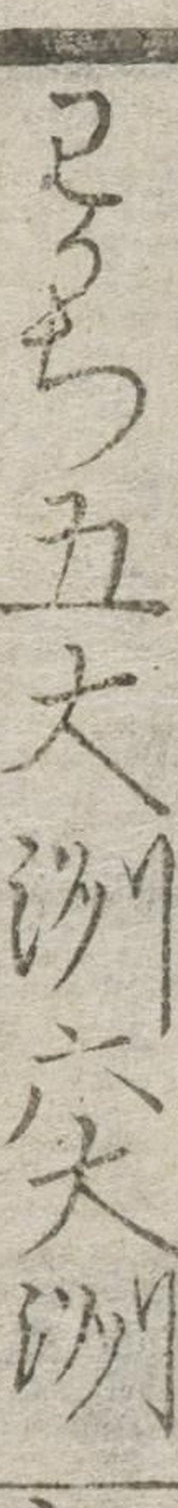わかち五大洲六大洲
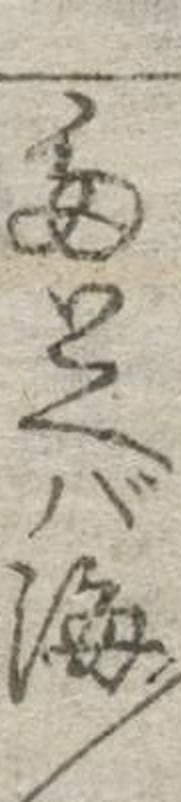たとへば海
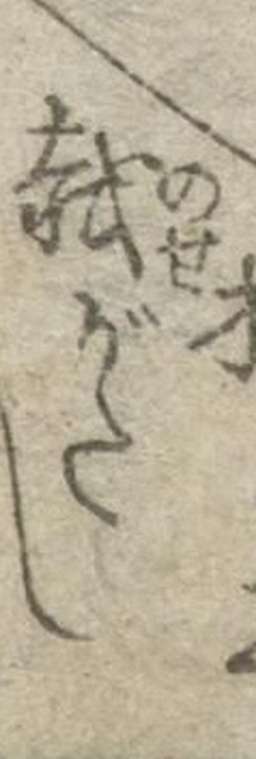載がたし
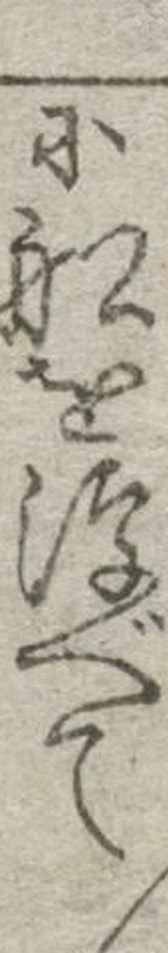に船を浮べて
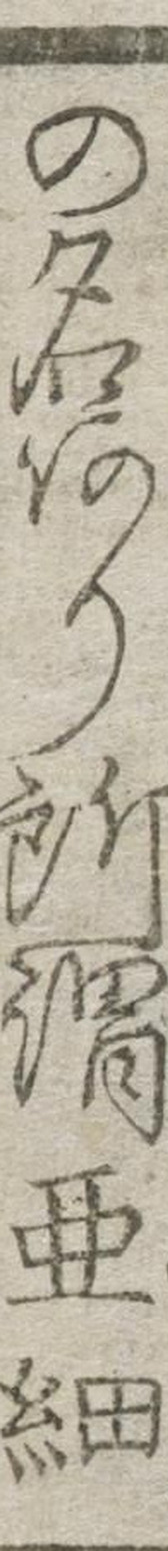の名あり所謂亜細
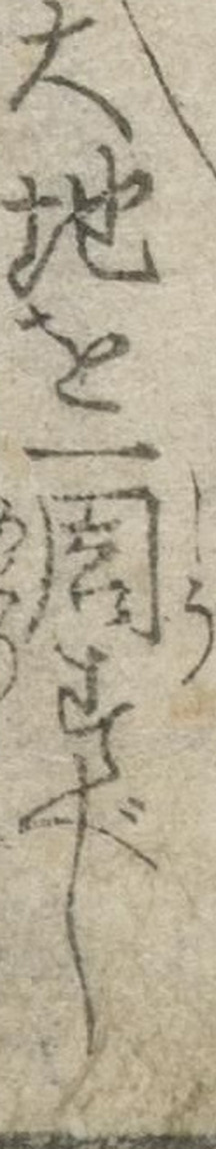大地を一周すべし
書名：訓蒙天地辨　天
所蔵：東京大学地震研究所図書室 Earthquake Research Institute Library, The University of Tokyo, JAPAN
